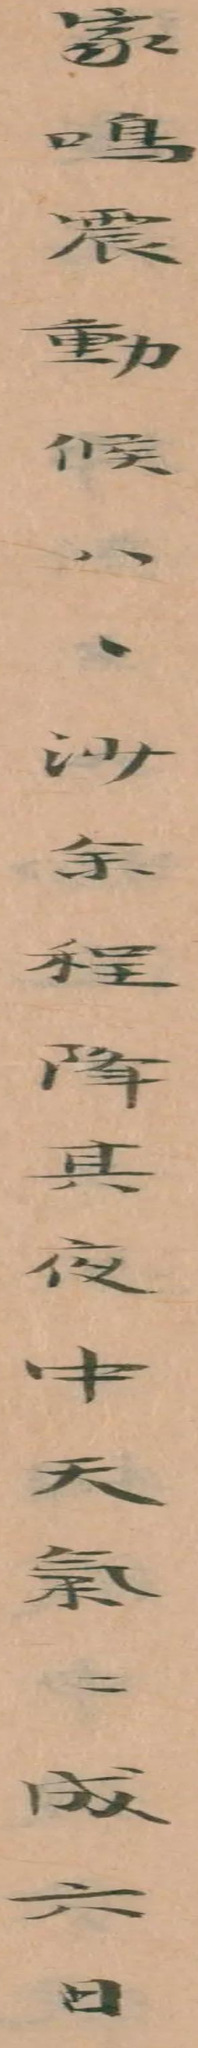家鳴震動候ハゝ沙余程降其夜中天気二成六日
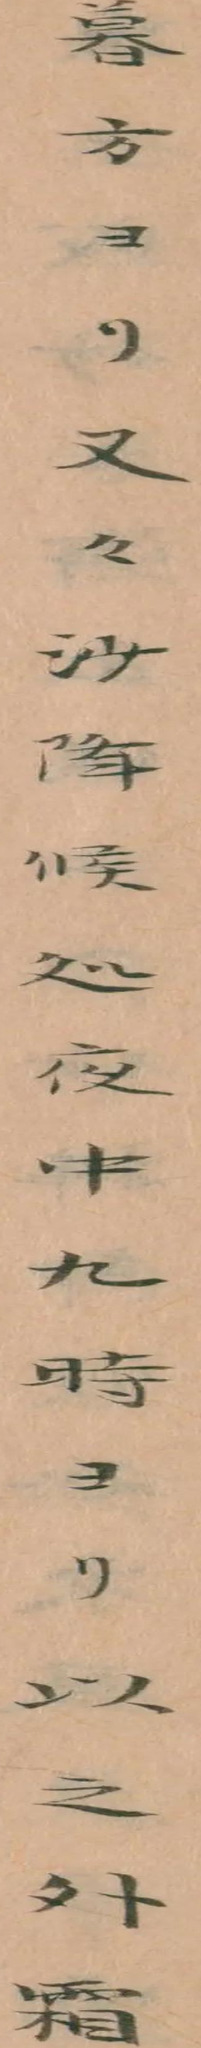暮方ヨリ又々沙降候処夜中九時ヨリ以之外霜
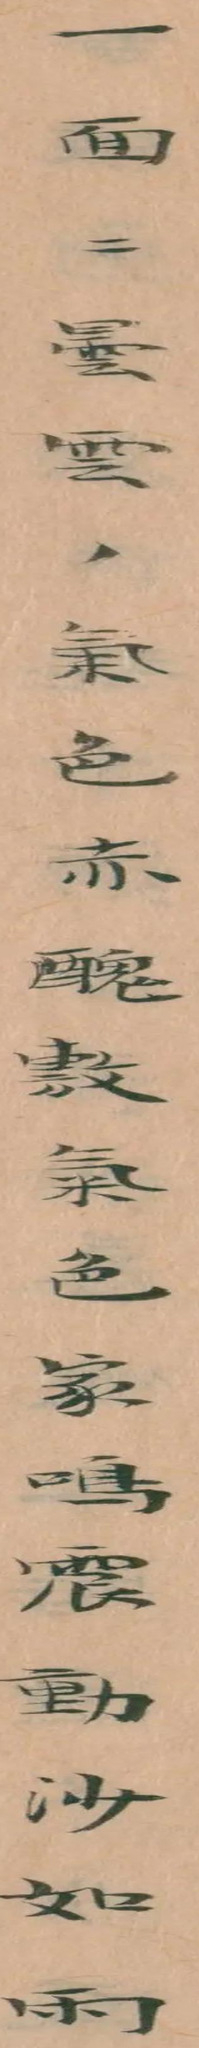一面二曇雲ノ気色赤醜敷気色家鳴震動沙如雨
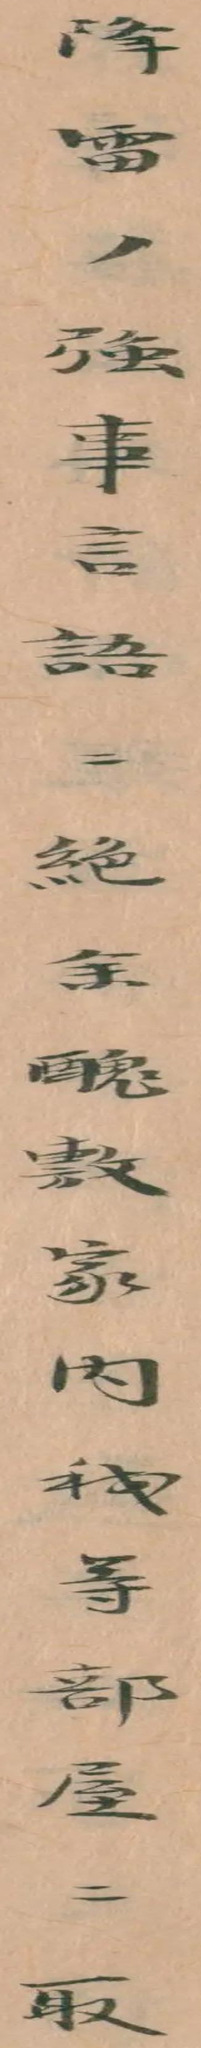降雷ノ強事言語二絶余醜敷家内我等部屋二取
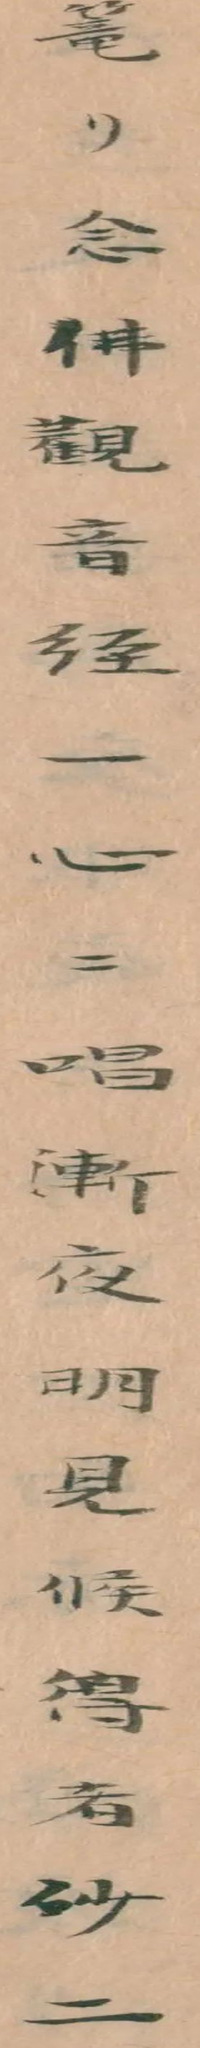篭り念仏観音経一心二唱漸夜明見候得者砂二
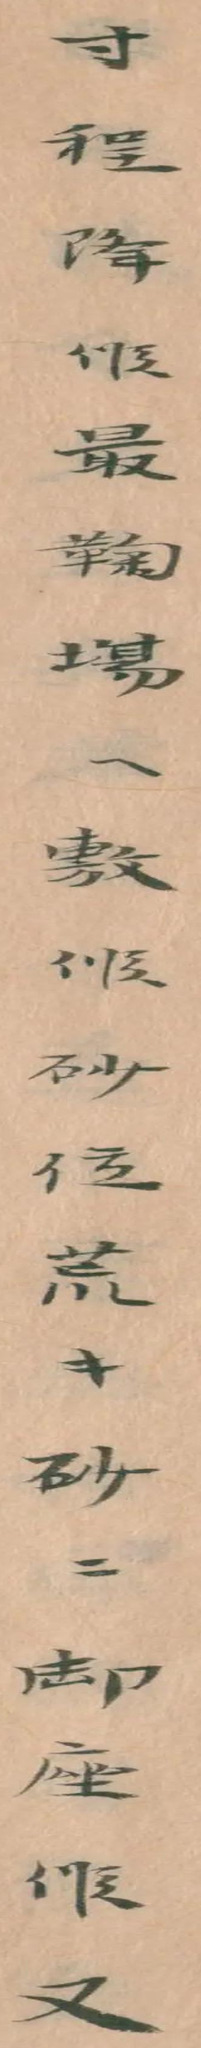寸程降候最鞠場へ敷候砂位荒キ砂二御座候又
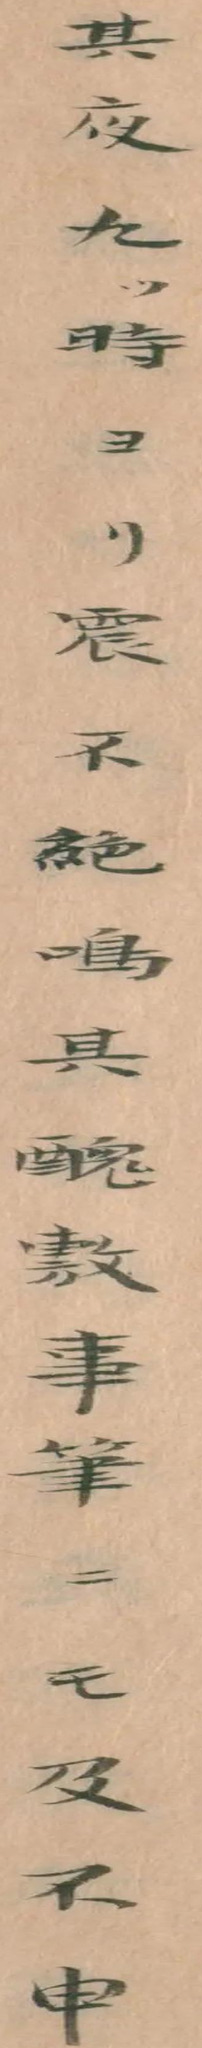其夜九ッ時ヨリ震不絶鳴其醜敷事筆ニモ及不申
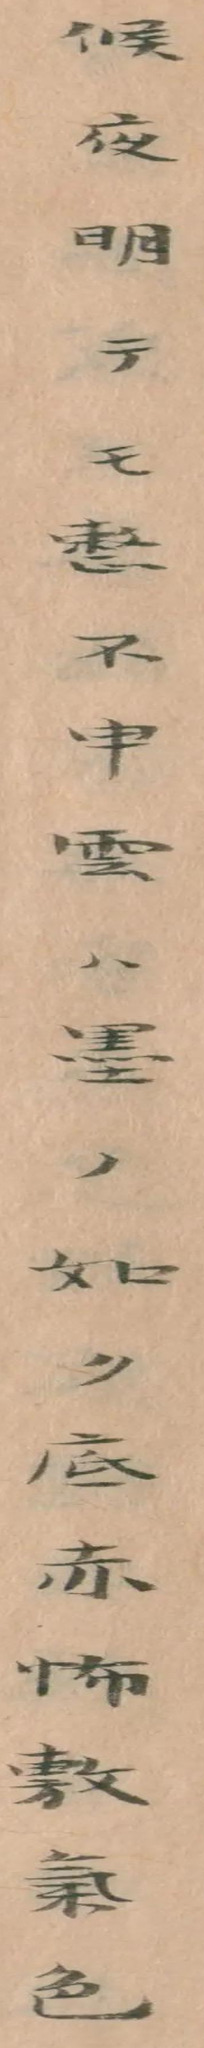候夜明テモ整不申雲ハ墨ノ如ク底赤怖敷気色
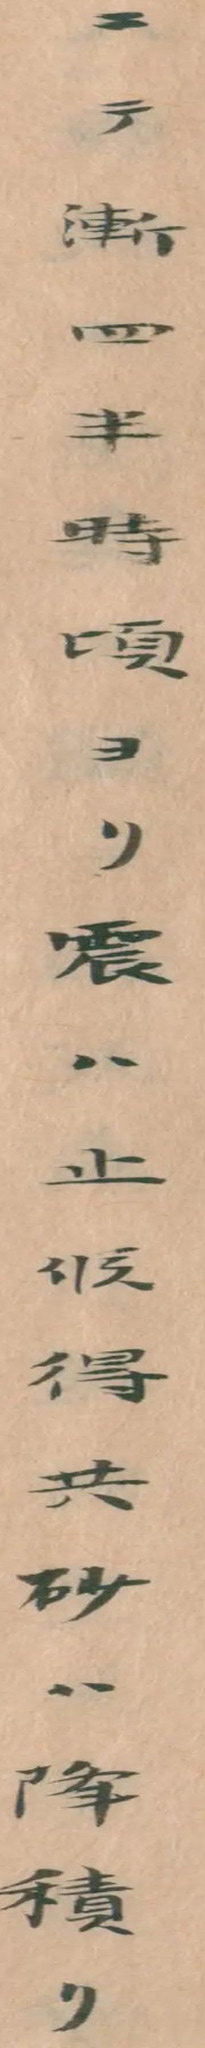ニテ漸四半時頃ヨリ震ハ止候得共砂ハ降積り
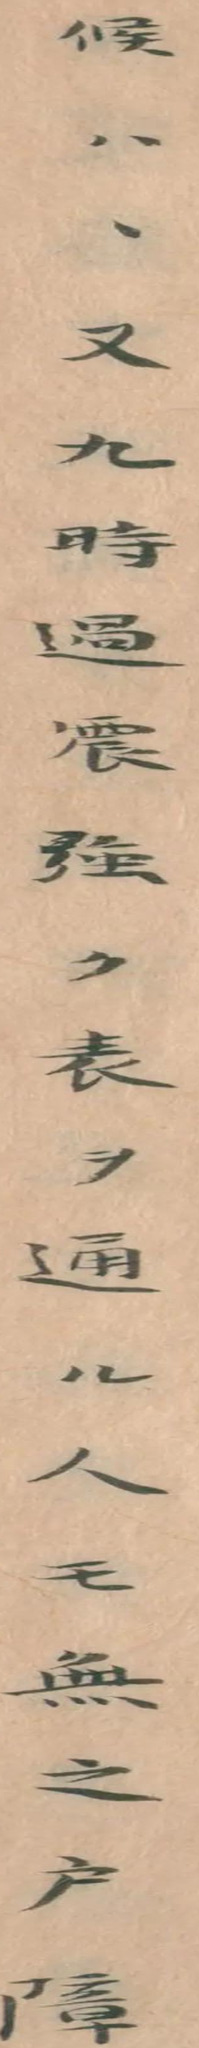候ハゝ又九時過震強ク表ヲ通ル人モ無之戸障

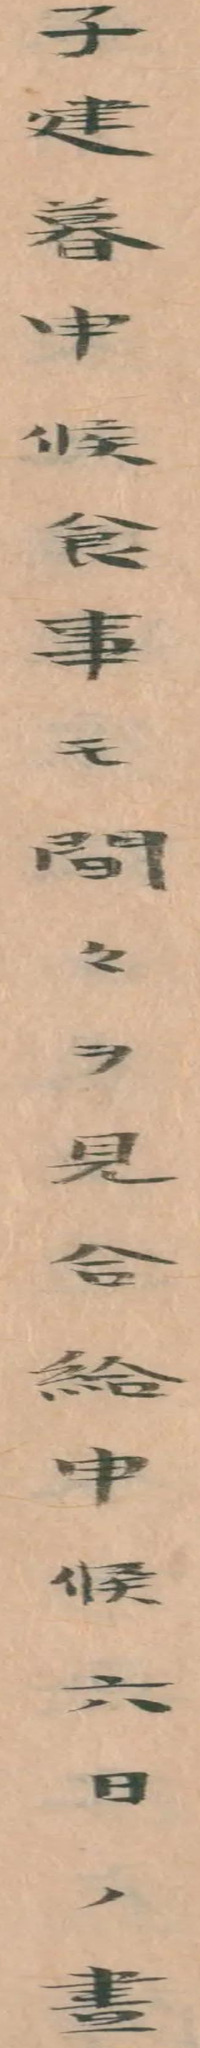子建暮申候食事モ間々ヲ見合給申候六日ノ晝
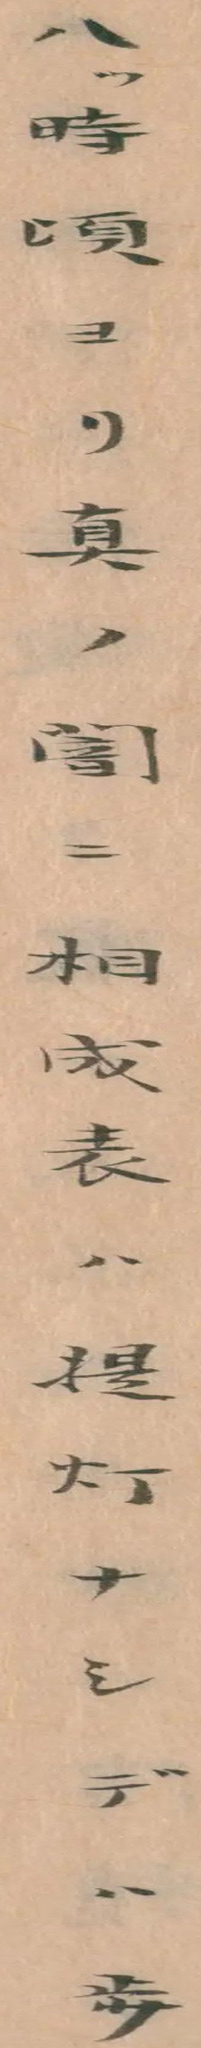八ッ時頃ヨリ真ノ闇二相成表ハ提灯ナシデハ歩
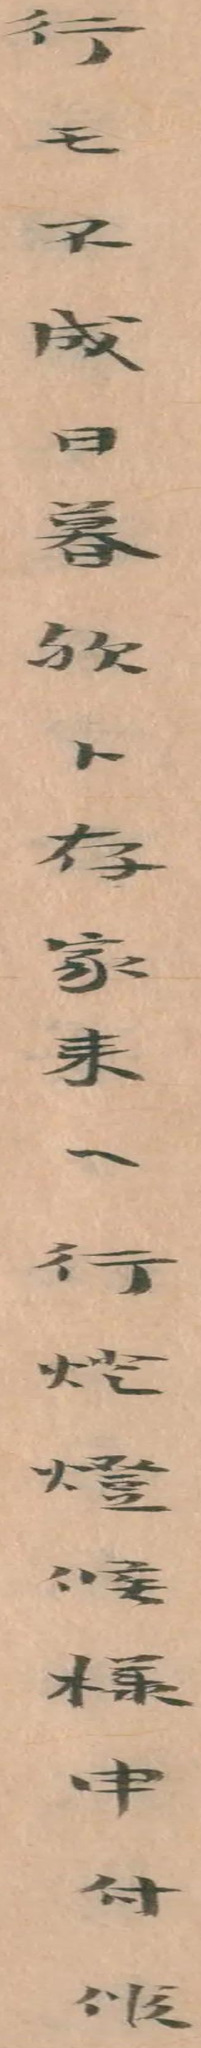行モ不成日暮歟ト存家来へ行燈燈候様申付候
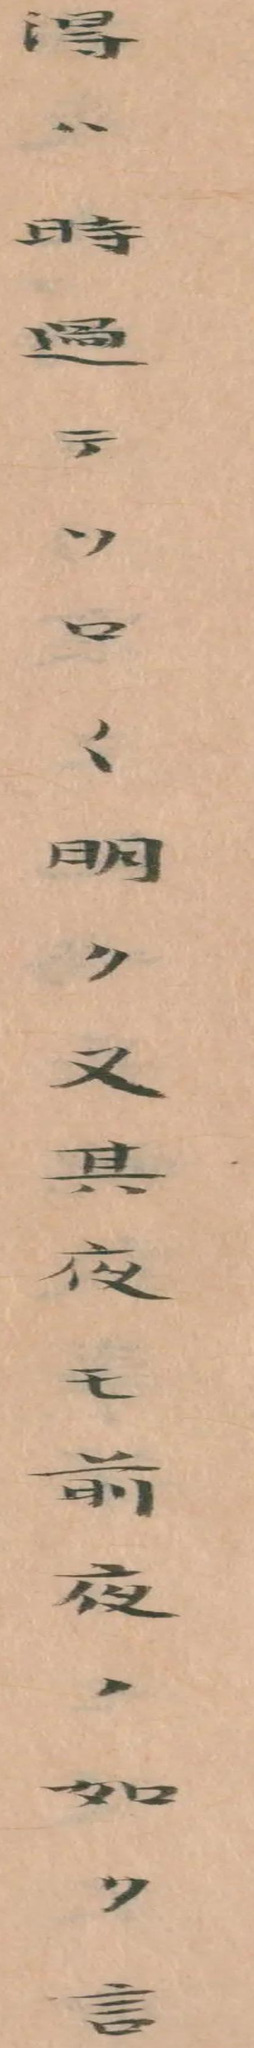得ハ時過テソロ〳〵明ク又其夜モ前夜ノ如ク言
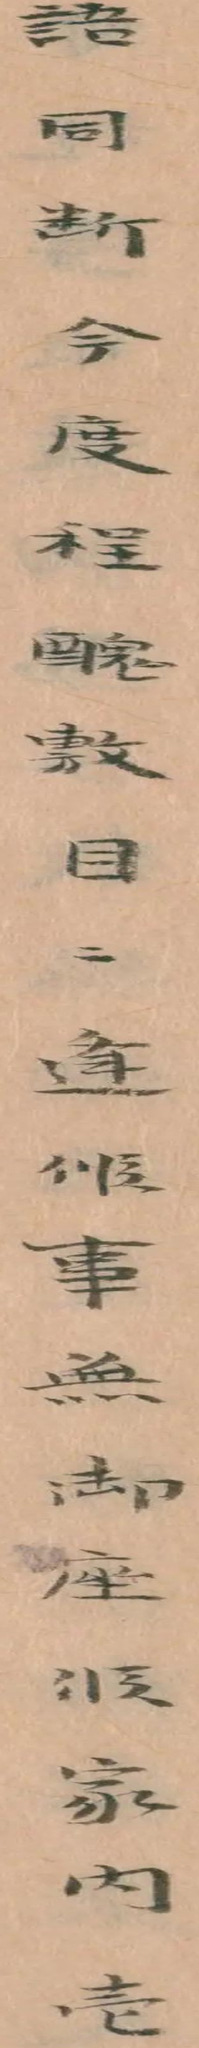語同断今度程醜敷目二逢候殊無御座候家内壱
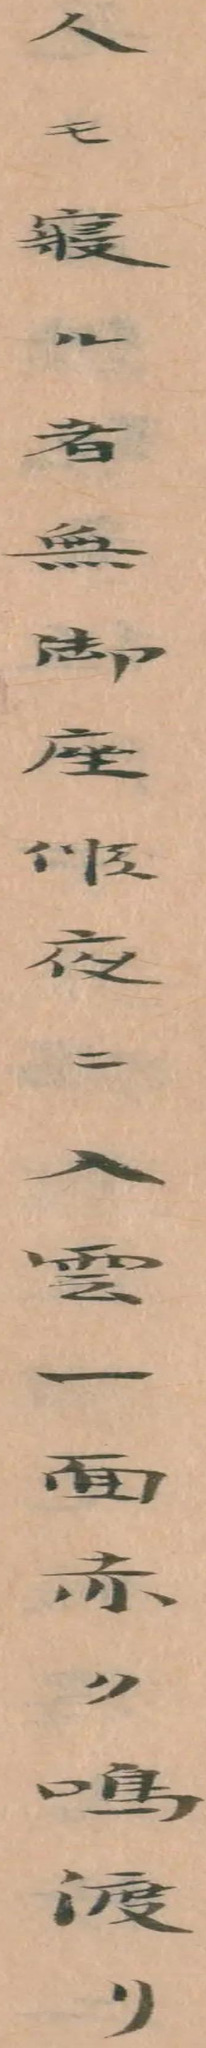人モ寝ㇽ者無御座候夜二入雲一面赤ク鳴渡り
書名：地災撮要. 巻1(噴火山・地震ノ部)
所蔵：国立国会図書館 National Diet Library, JAPAN
